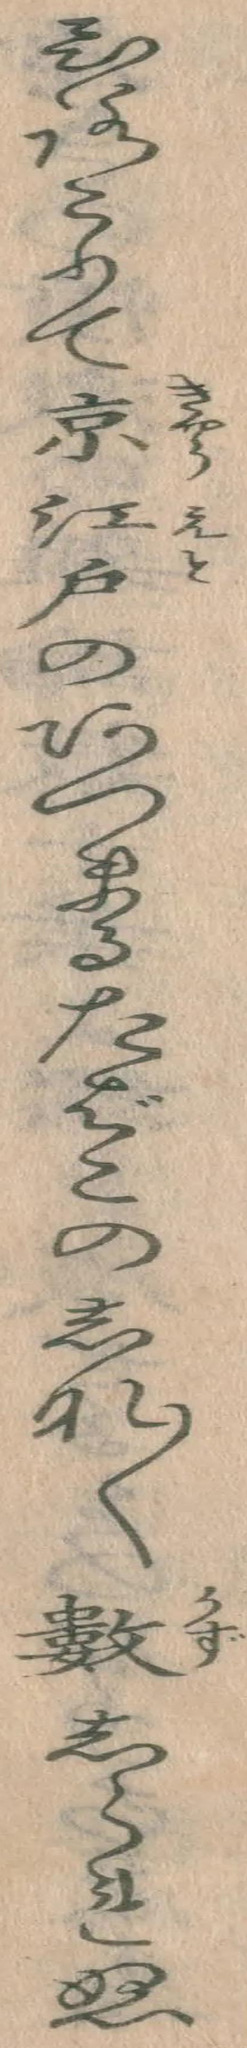ひろこりて京江戸のあつまるたばこのしな〳〵数しられぬ
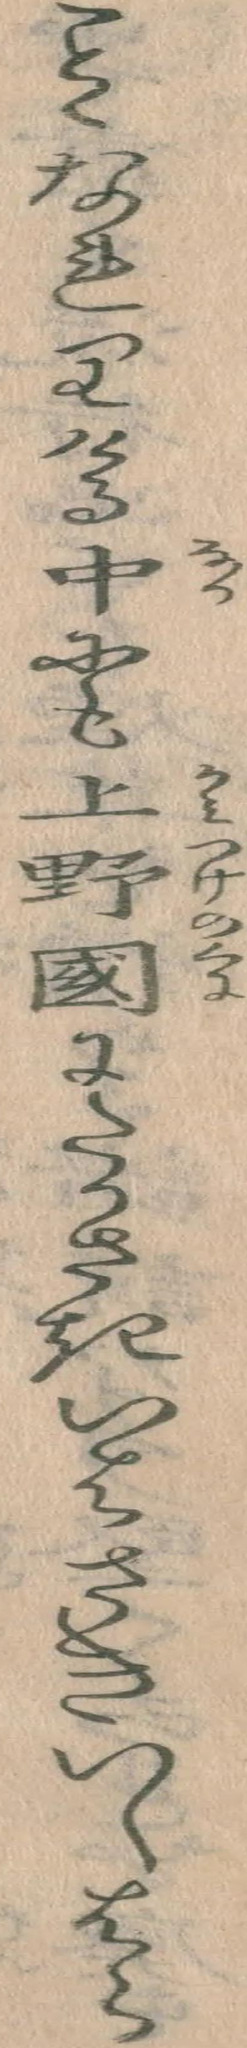ことゝなれりける中にも上野国にたかさきいはさきいしはら
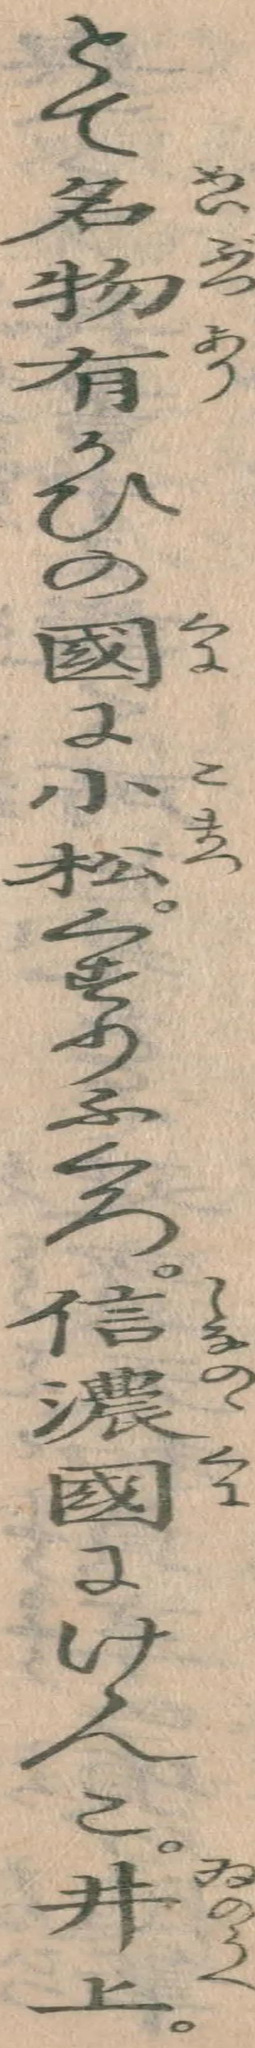とて名物有かひの国に小松。くすりふくろ。信濃国にけんこ。井上。
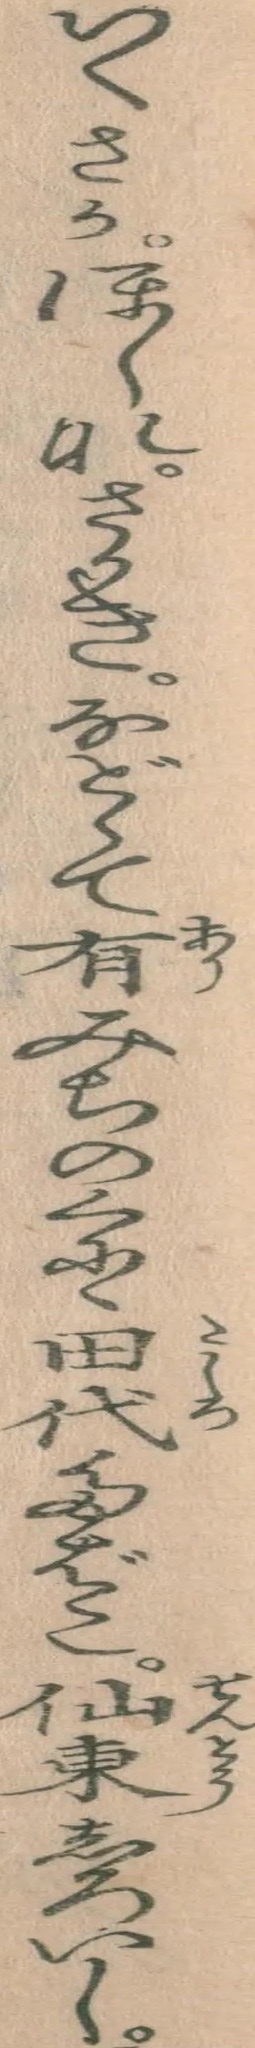いくさか。ほしな。さかき。などゝて有みちのくにゝ田代たばこ。仙東しろいし。
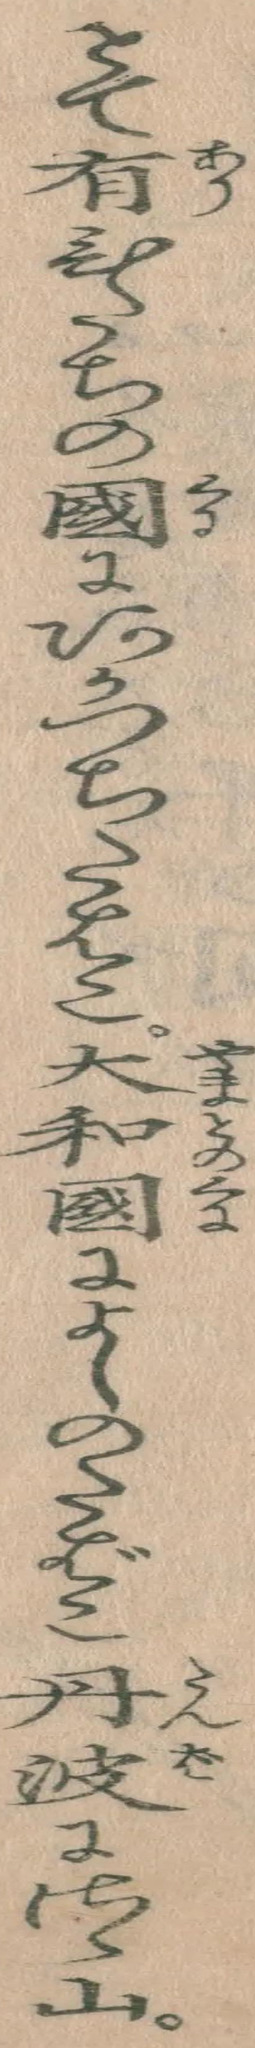とて有ひたちの国にあかつちたはこ。大和国によしのたばこ丹波にさゝ山。
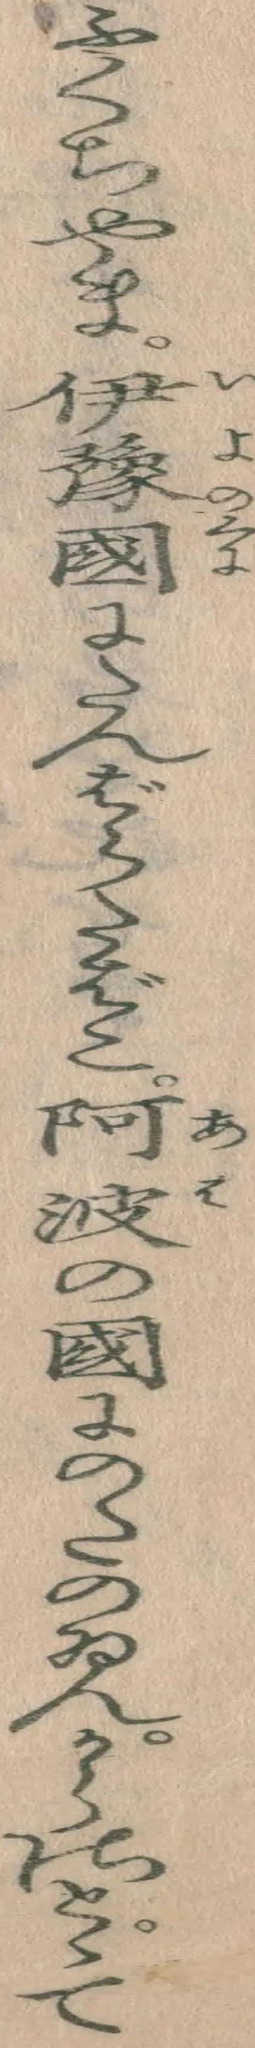ふくちやま。伊予国にたんばらたばこ。阿波の国にのたのゐん。からさと。ゝて
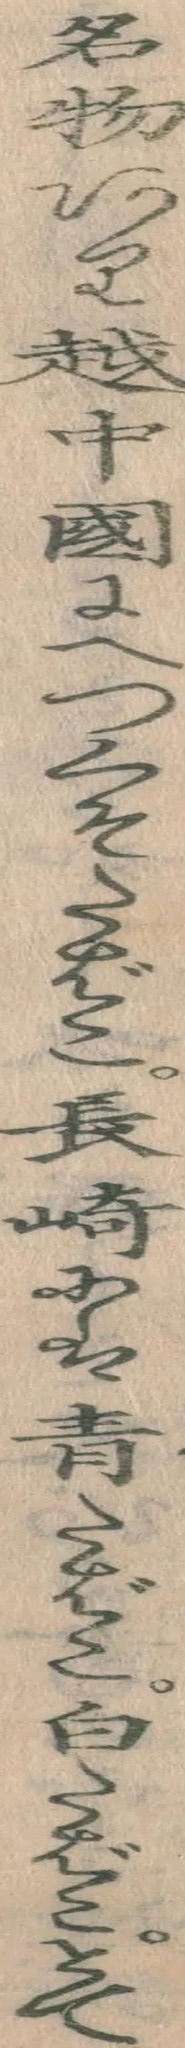名物あり越中国にへつくそたばこ。長崎には青たばこ。白たばこ。とて
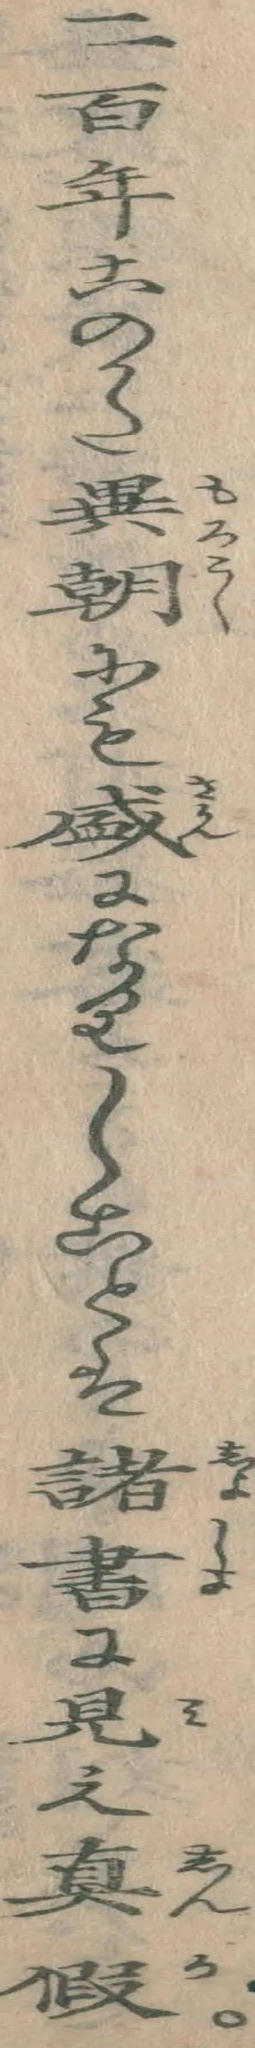二百年このかた異朝にも盛になりしことは諸書に見え真仮。

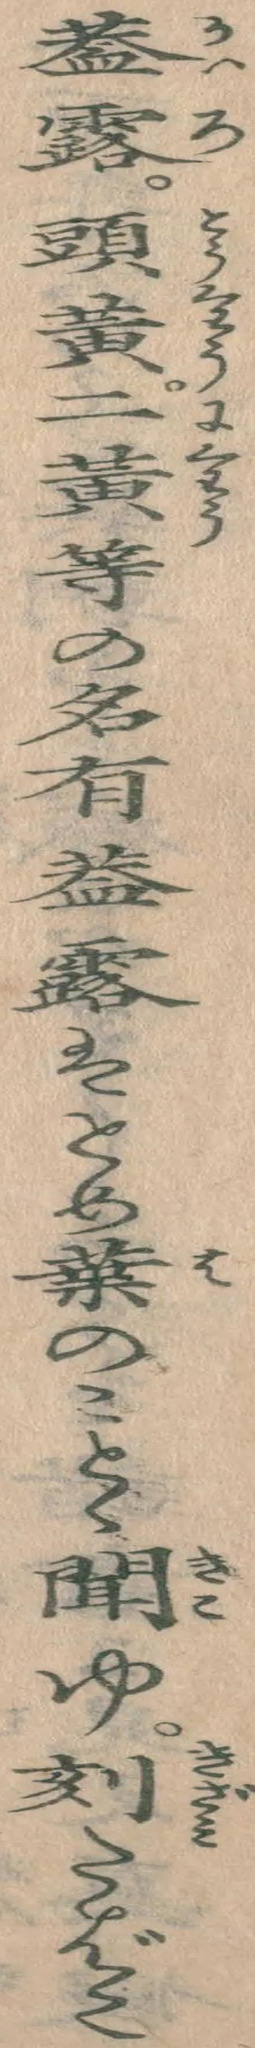蓋露。頭黄。二黄等の名有蓋露はとめ葉のことゝ聞ゆ。刻たばこ
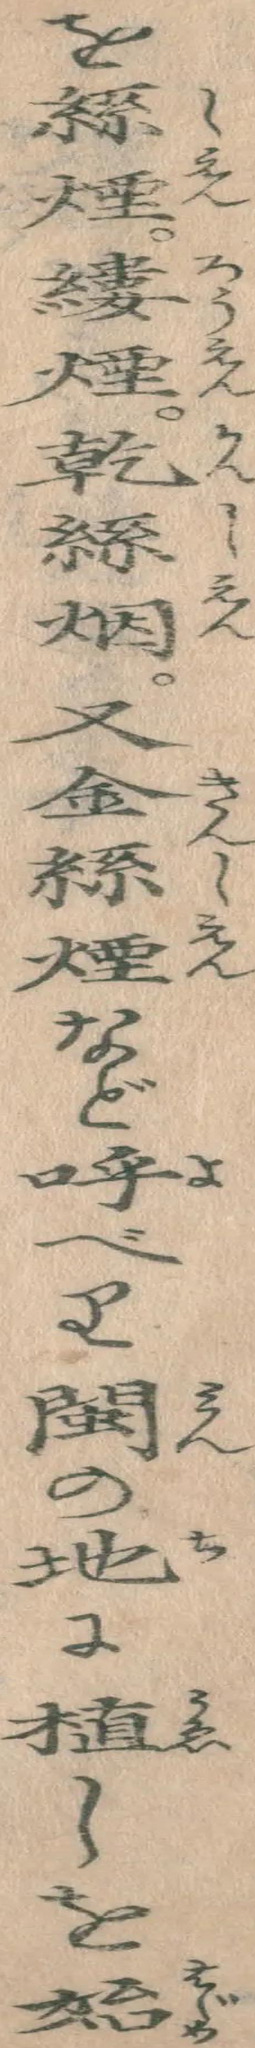を糸煙。縷煙。乾糸煙。又金糸煙など呼べり閩の地に植しを始
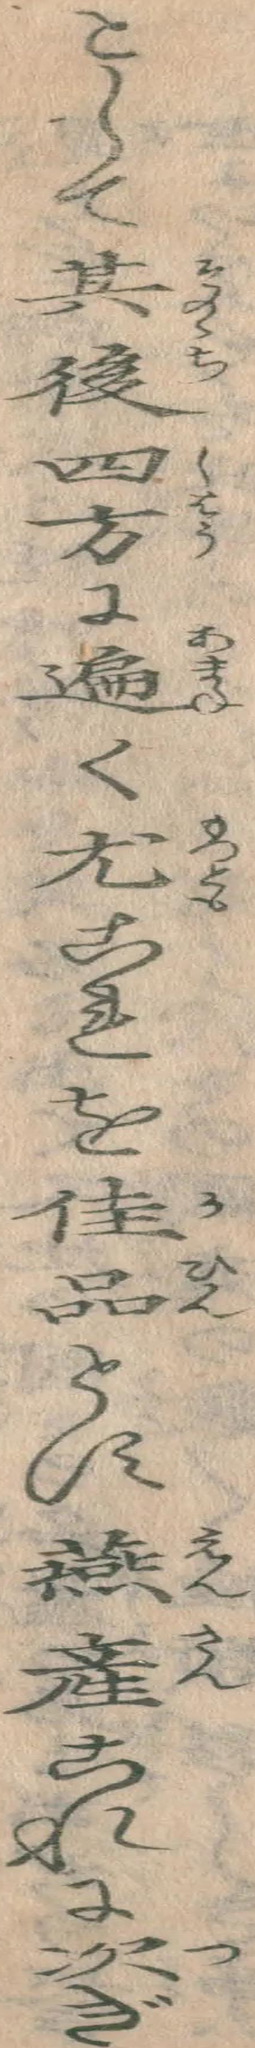として其後四方に遍く尤これを佳品とす燕産これに次ぎ
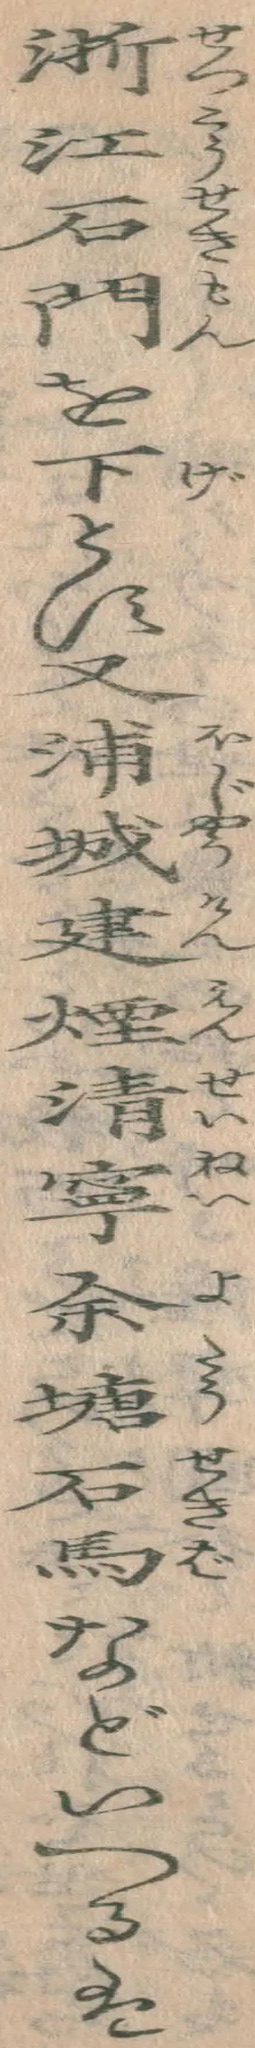浙江石門を下とす又浦城建煙清寧余塘石馬などいへるは
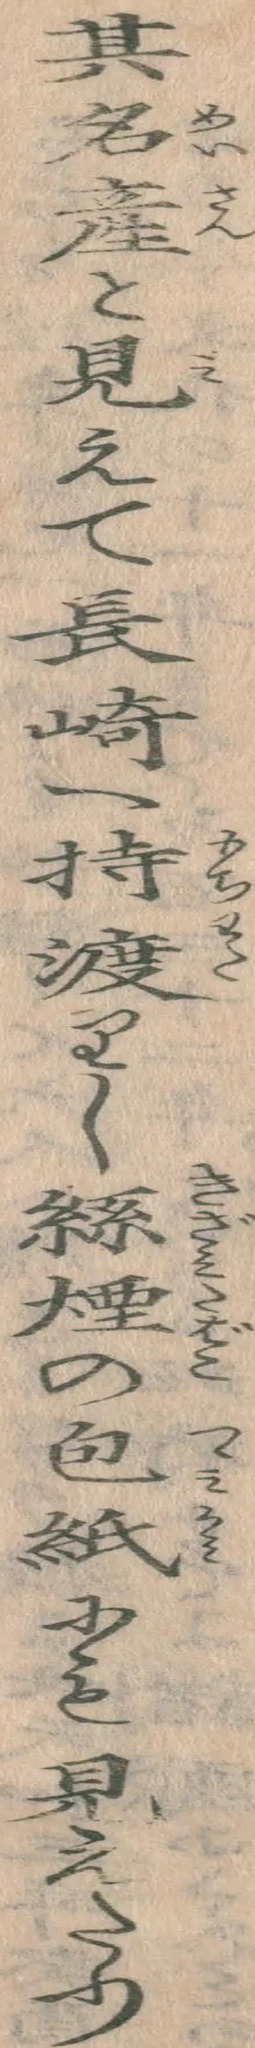其名産と見えて長崎へ持渡りし糸煙の包紙にも見えたり
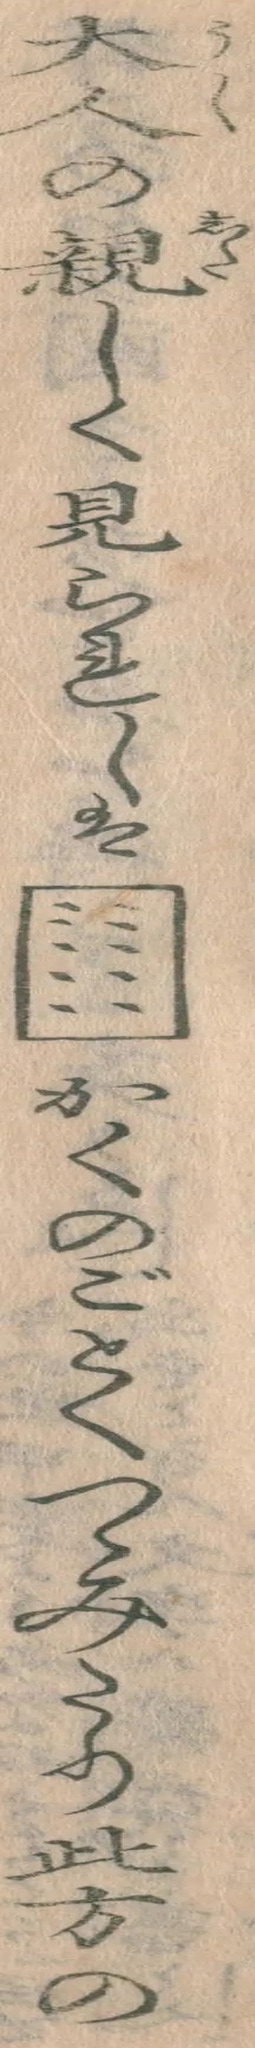大人の親しく見られしはかくのごとくつゝみたり此方の
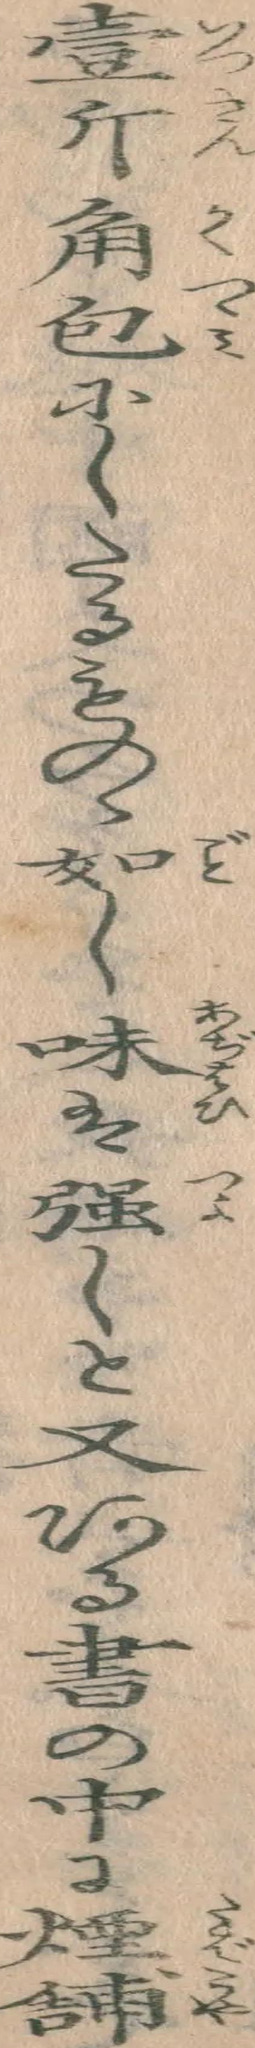壱斤角包にしたるものゝ如し味は強しと又ある書の中に煙舗
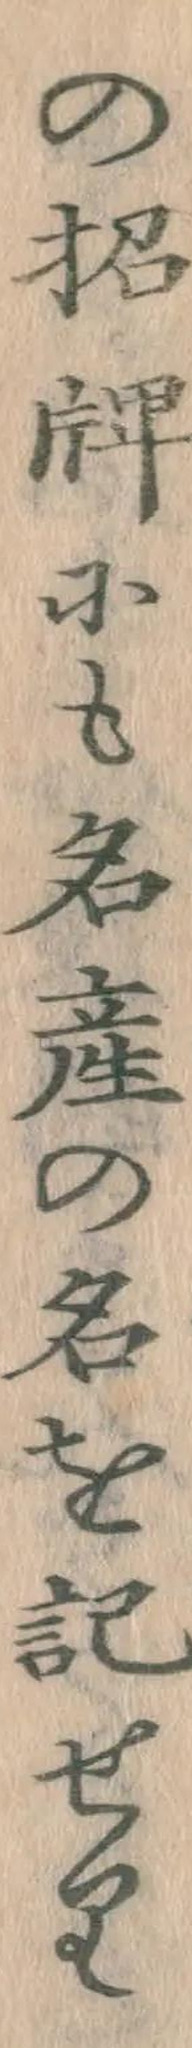の招牌も名産の名を記せり
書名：目さまし草
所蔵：国立国会図書館 National Diet Library, JAPAN
